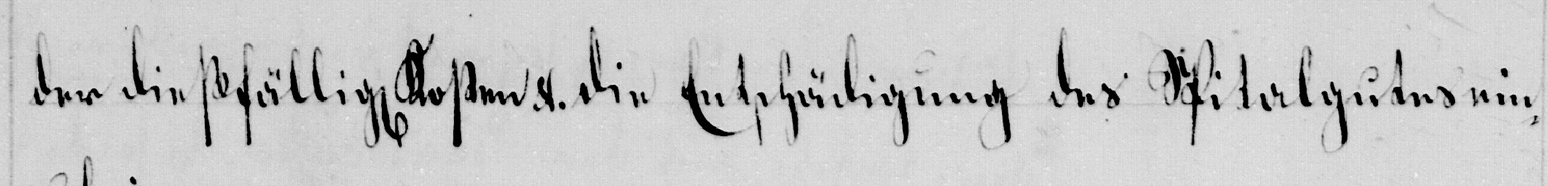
der dießfällig[en] Kosten &. die Entschädigung des Spitalgutes ein¬
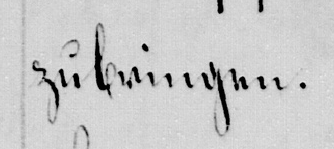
zubringen.
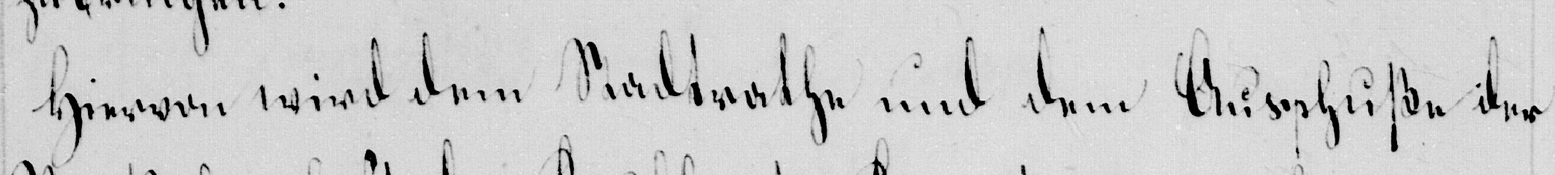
Hiervon wird dem Stadtrathe und dem Ausschuße der
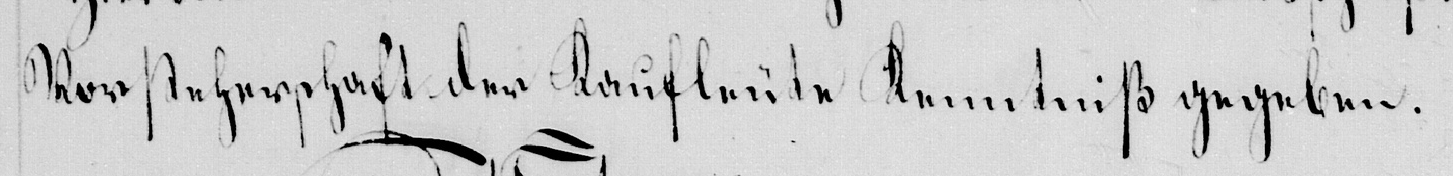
Vorsteherschaft der Kaufleute Kenntniß gegeben.
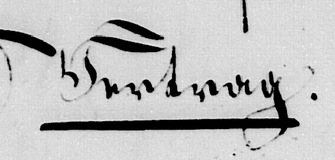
Vertrag.
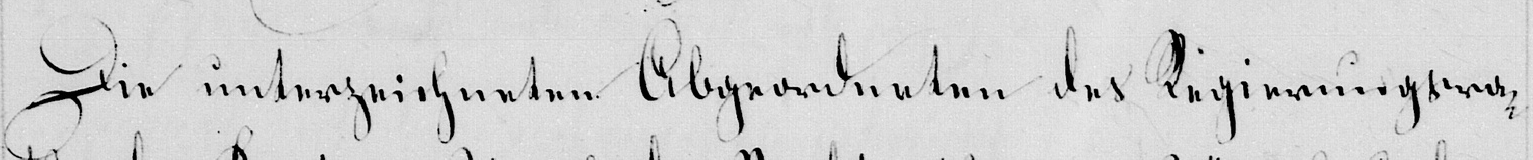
Die unterzeichneten Abgeordneten des Regierungsra¬
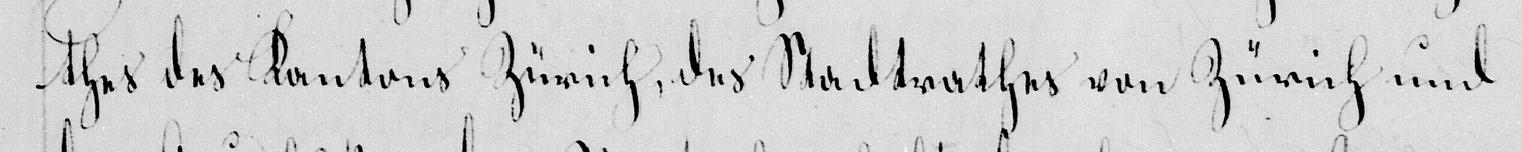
thes, des Kantons Zürich, des Stadtrathes von Zürich und
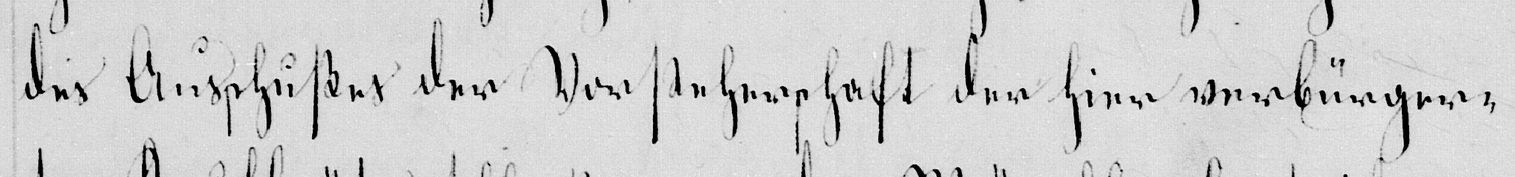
des Ausschußes der Vorsteherschaft der hier verbürger¬
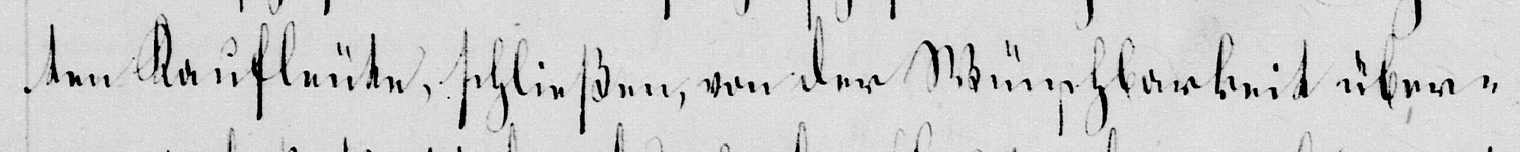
ten Kaufleute, schließen, von der Wünschbarkeit über¬
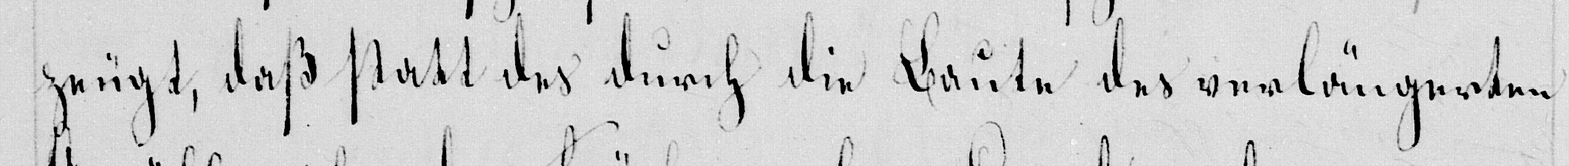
zeugt, daß statt des durch die Baute des verlängerten
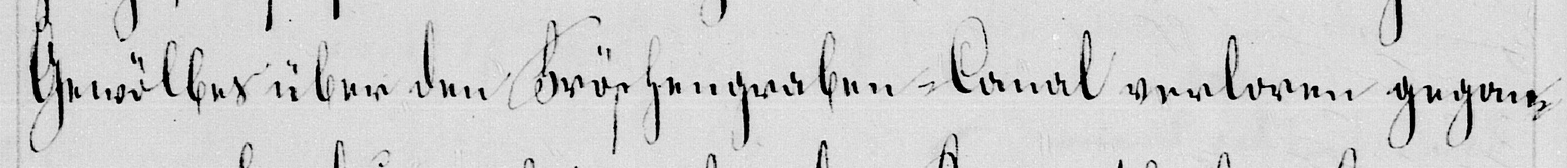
Gewölbes über den Fröschengraben-Canal verloren gegan¬
